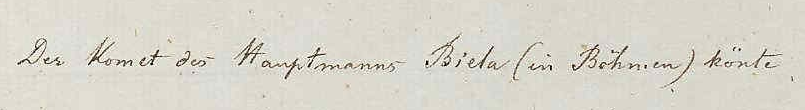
Der Komet des Hauptmanns Biela könte
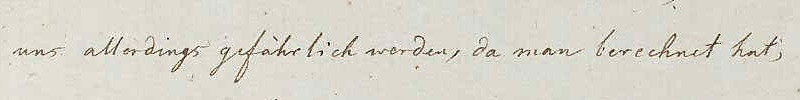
uns allerdings gefährlich werden, da man berechnet hat,
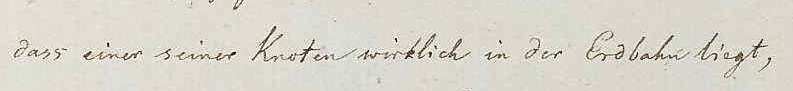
dass einer seiner Knoten wirklich in der Erdbahn liegt,
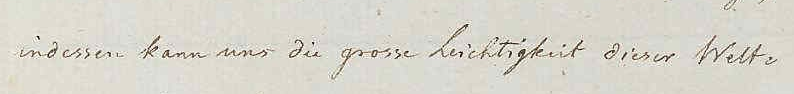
indessen kann uns die grosse Leichtigkeit dieser Welt-
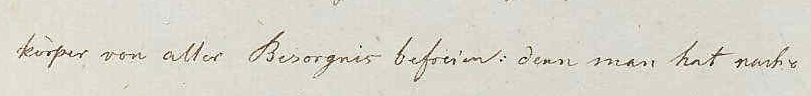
körper von aller Besorgnis befreien: denn man hat nach-
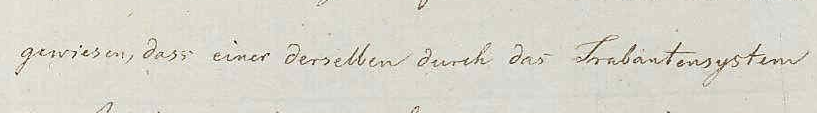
gewiesen, dass einer derselben durch das Trabantensystem
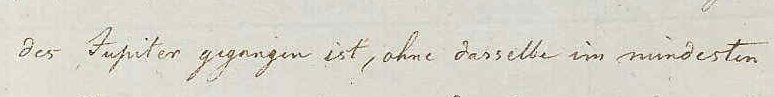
des Jupiter gegangen ist, ohne dasselbe im mindesten
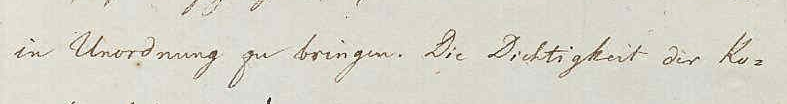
in Unordnung zu bringen. Die Dichtigkeit der Ko-
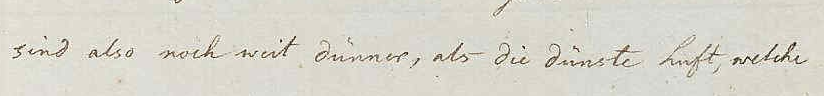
sind also noch weit dünner, als die dünste Luft, welche
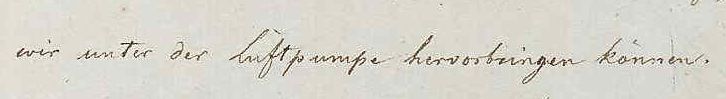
wir unter der Luftpumpe hervorbringen können.
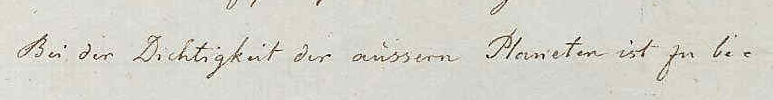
Bei der Dichtigkeit der äussern Planeten ist zu be-
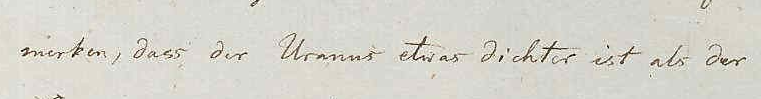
merken, dass der Uranus etwas dichter ist als der
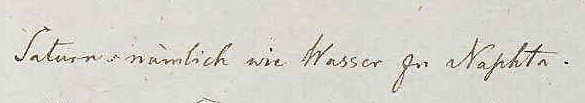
Saturn: nämlich wie Wasser zu Naphta.
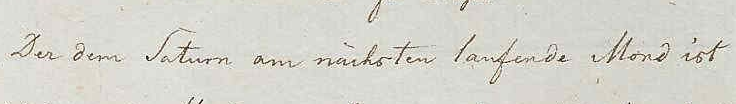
Der dem Saturn am nächsten laufende Mond ist
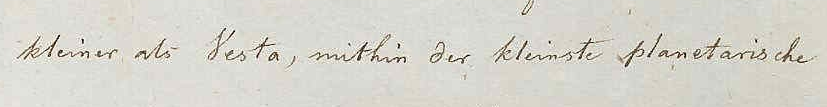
kleiner als Vesta, mithin der kleinste planetarische
